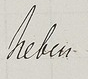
bevor
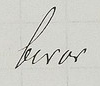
die
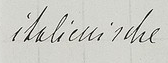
italienische u
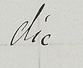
die
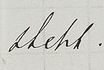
sche
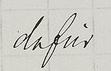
steht.
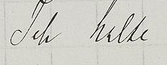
Ich halte
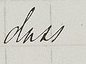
werth
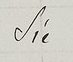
dass
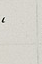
uns
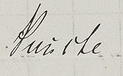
sprechen
